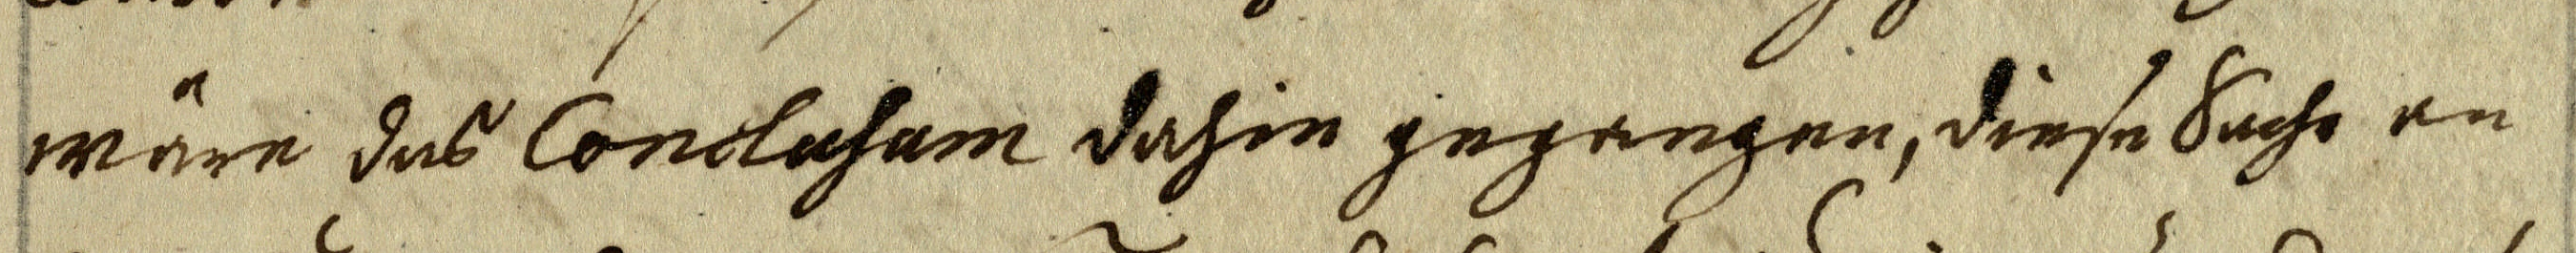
wäre das Conclusum dahin gegangen, diese Sache an
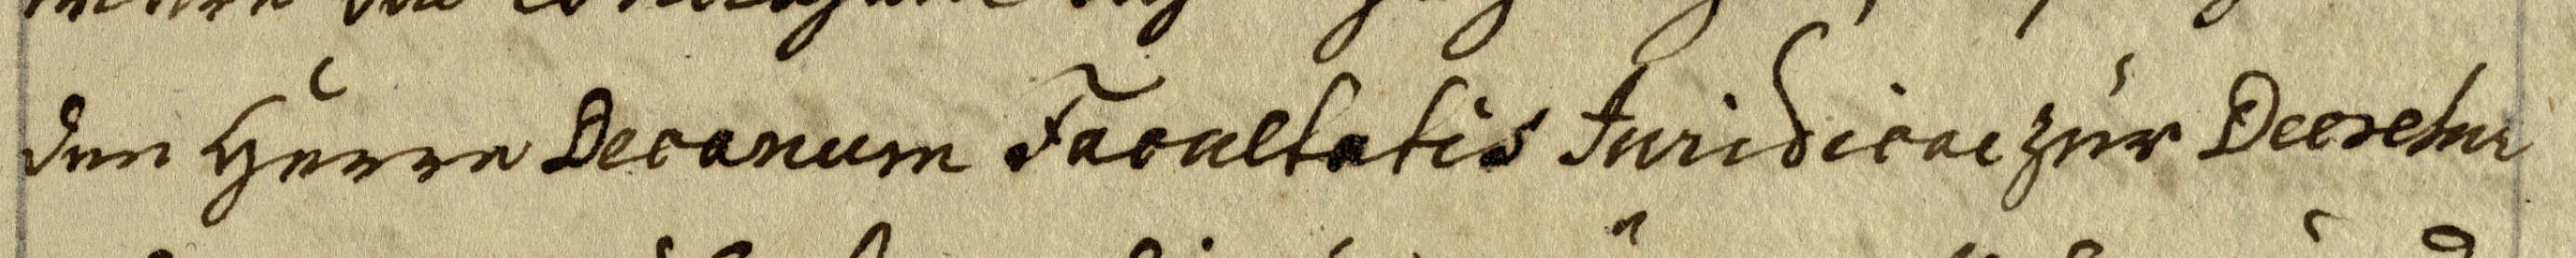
den Herrn Decanum Facultatis Juridicae zur Decretur
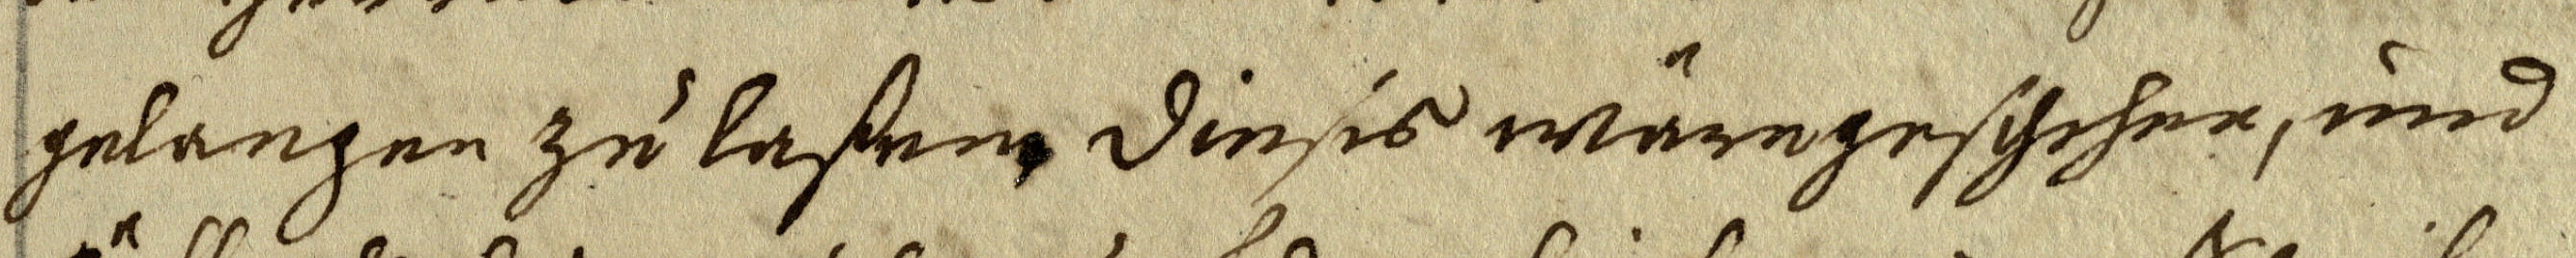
gelangen zu laßen. Dieses wäre geschehen, und
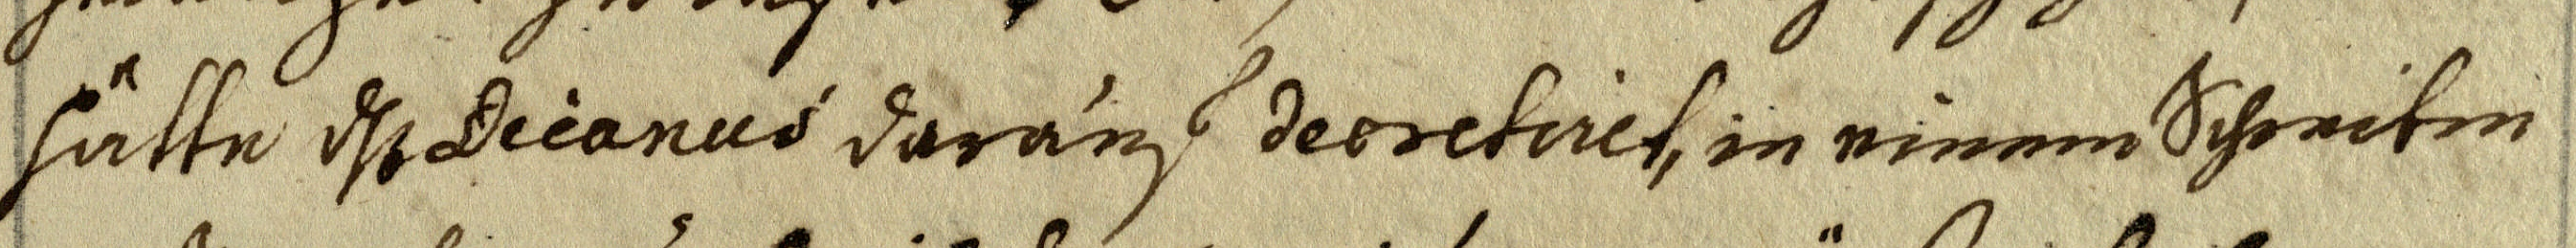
hätte dh Decanus darauf decretiret, in einem Schreiben
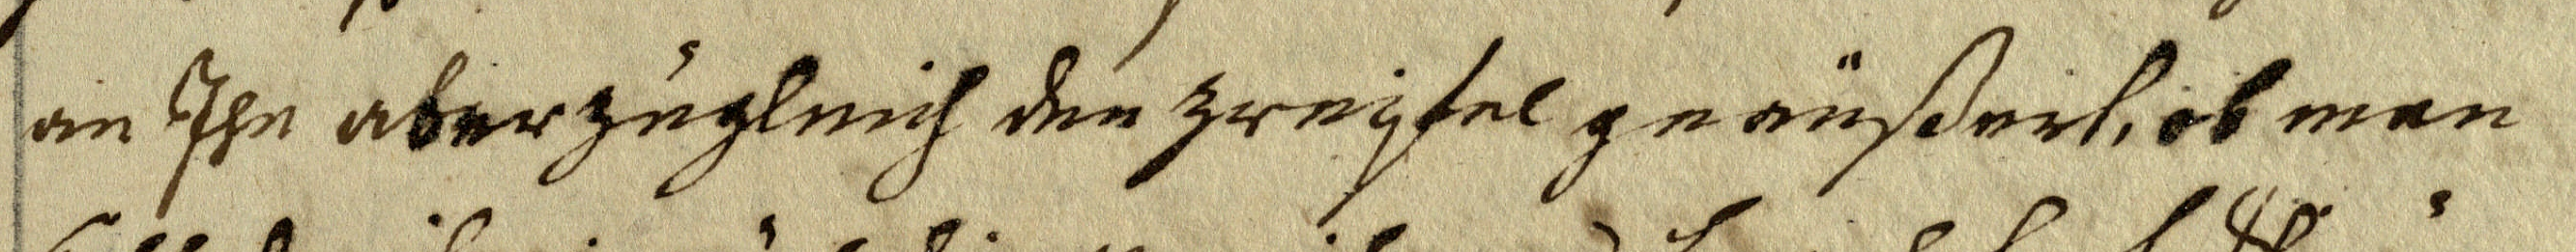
an Ihn aber zugleich den Zweifel geäussert, ob man
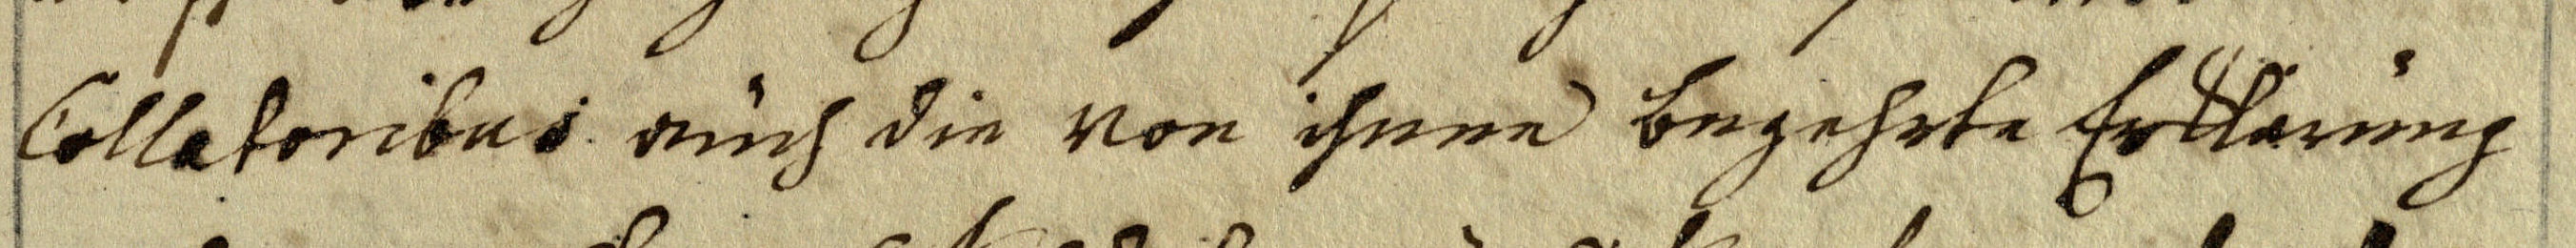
Collatoribus auch die von ihnen begehrte Erklärung
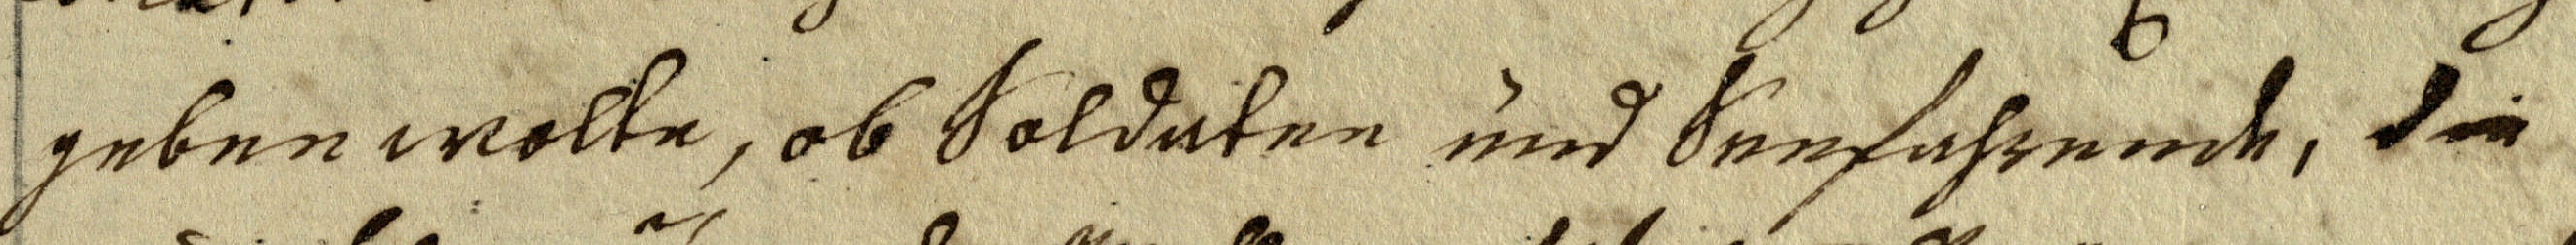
geben wolle, ob Soldaten und Seefahrende, die
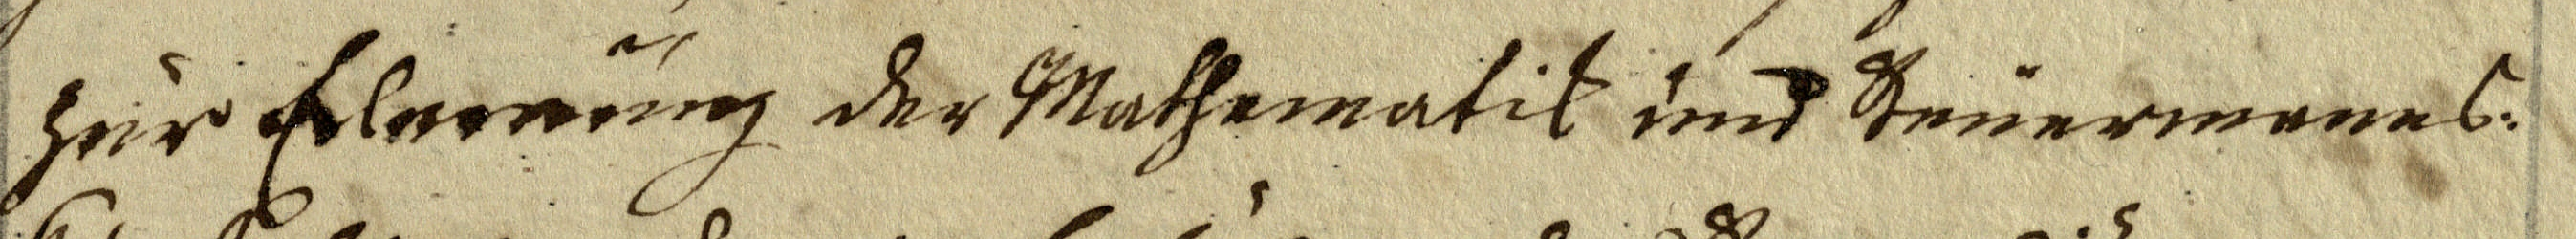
zur Erlernung der Mathematik und Steuermanns¬
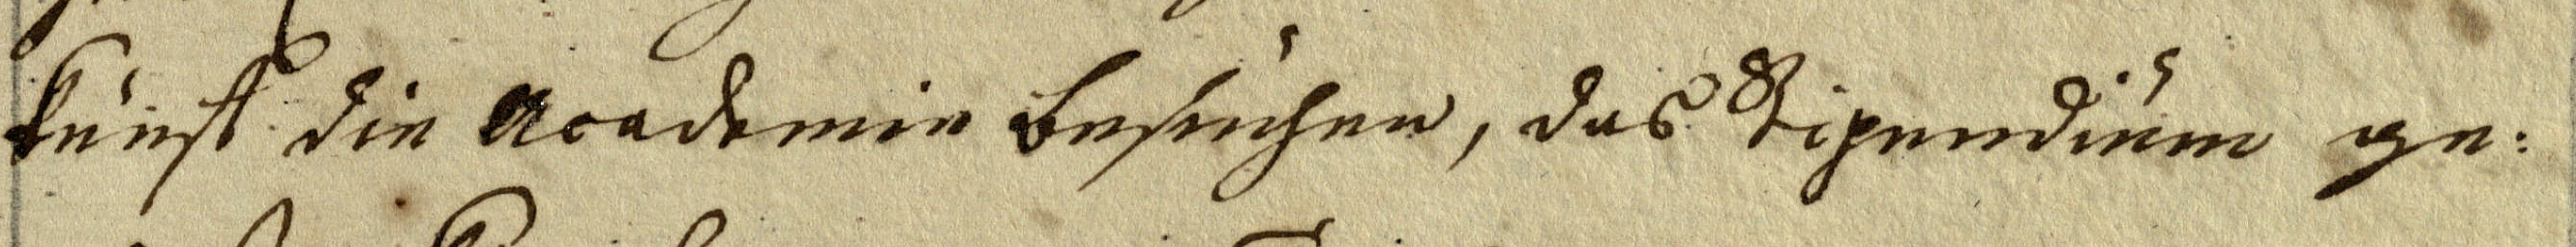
kunst die Academie besuchen, das Stipendium ge¬
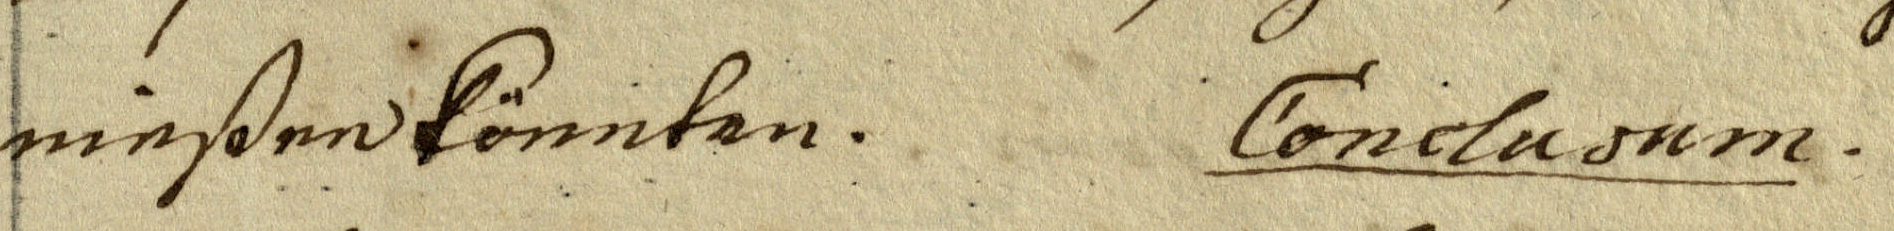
nießen könnten. Conclusum
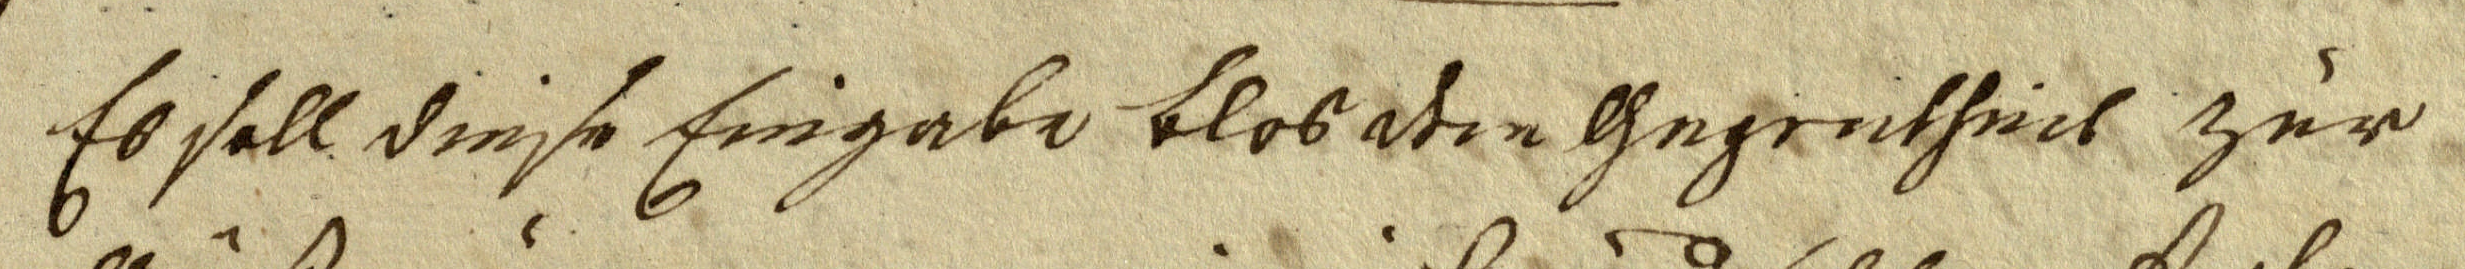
Es soll diese Eingabe blos dem Gegentheil zur
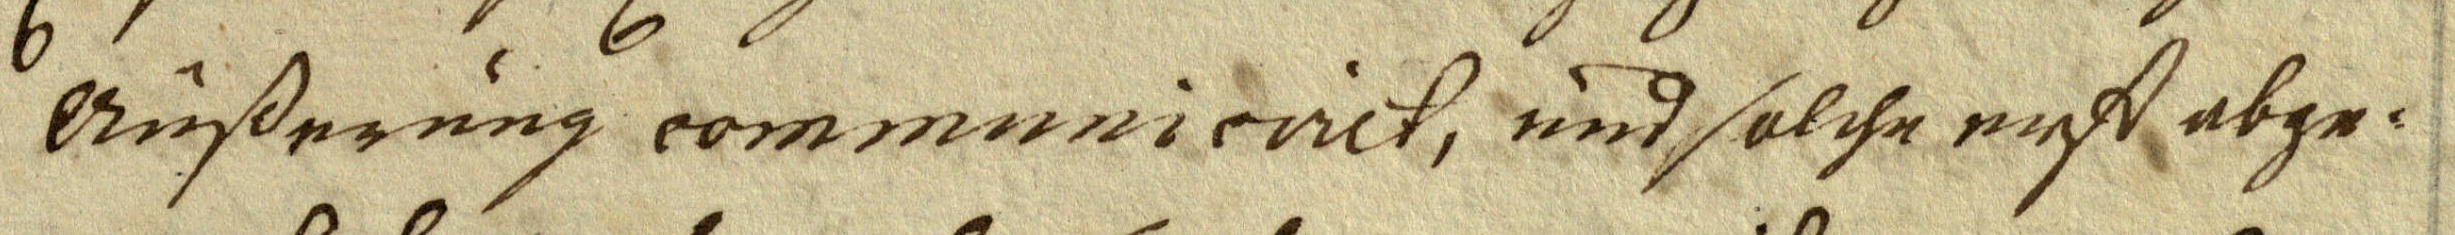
Äußerung communiciret, und solche nicht abge¬
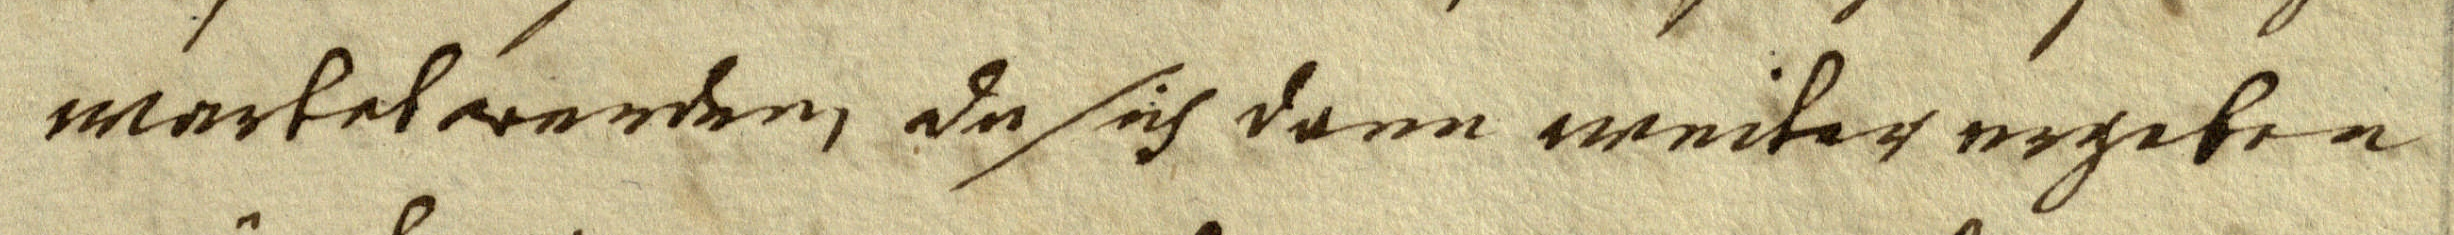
wartet werden, da sich dann weiter ergeben
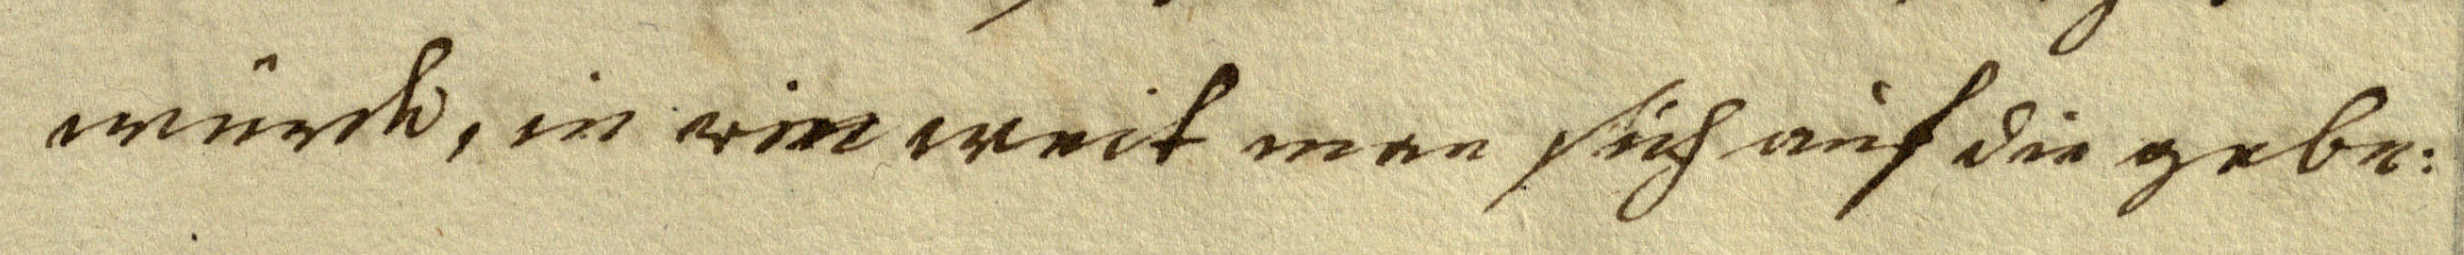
würde, in wie weit man sich auf die gebe¬
